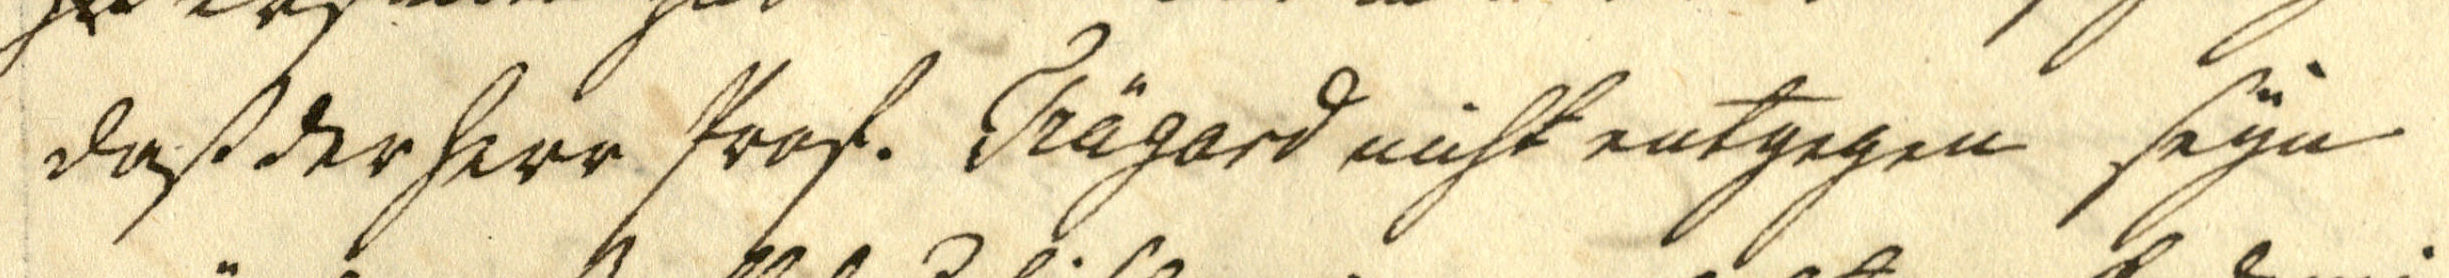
daß der Herr Prof. Trägard nicht entgegen seÿn
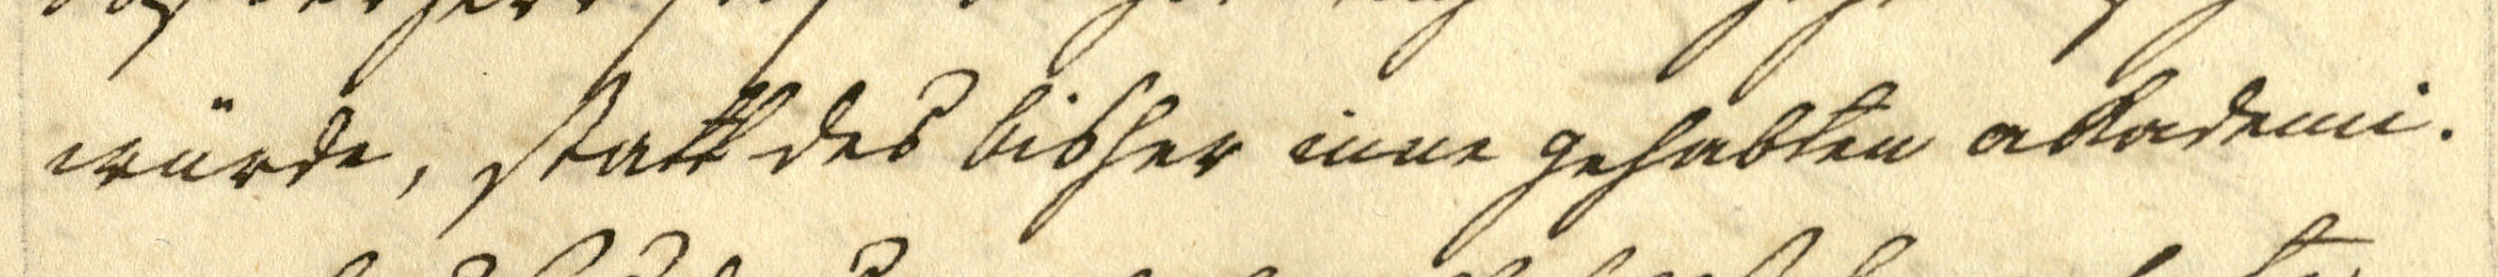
würde, statt des bisher inne gehabten akademi¬
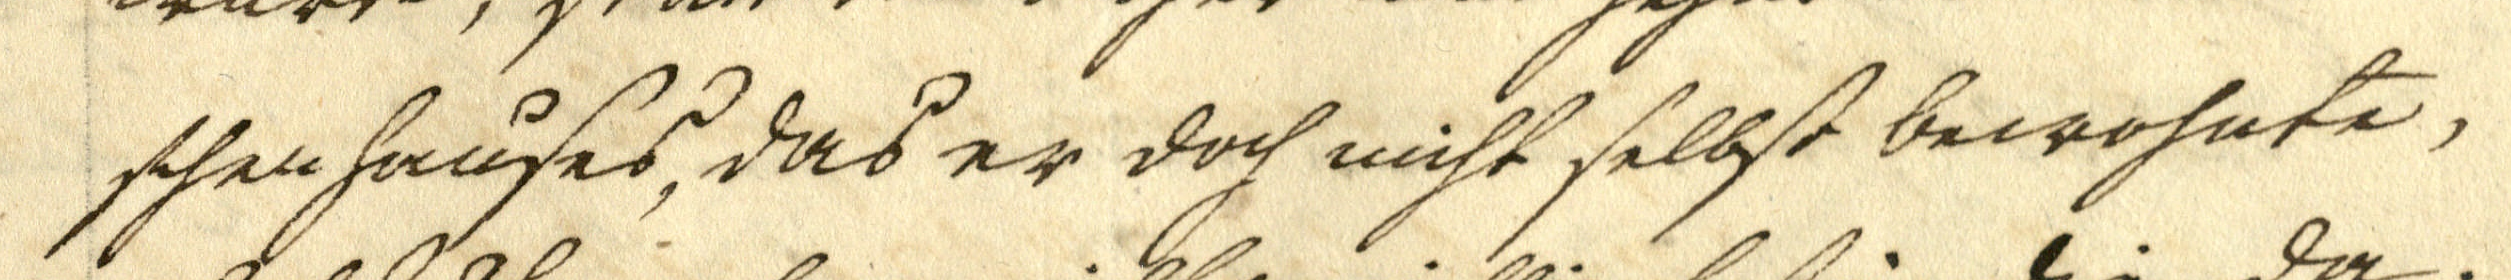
schen Hauses, das er da nicht selbst bewohnte,
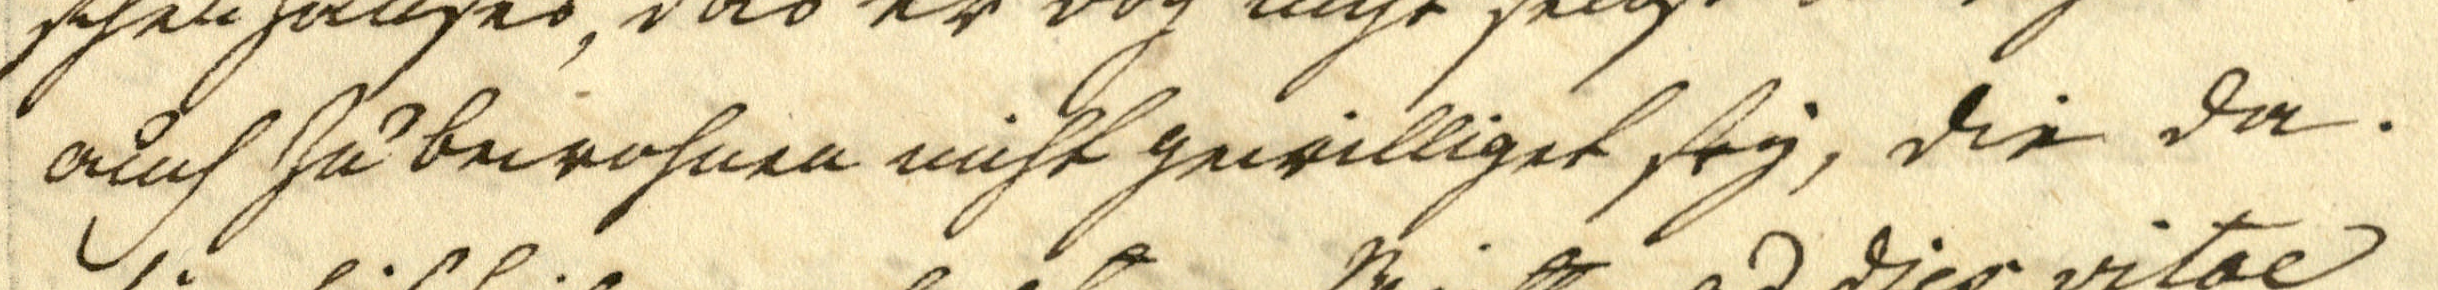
auch zu bewohnen nicht gewilliget seÿ, die da¬
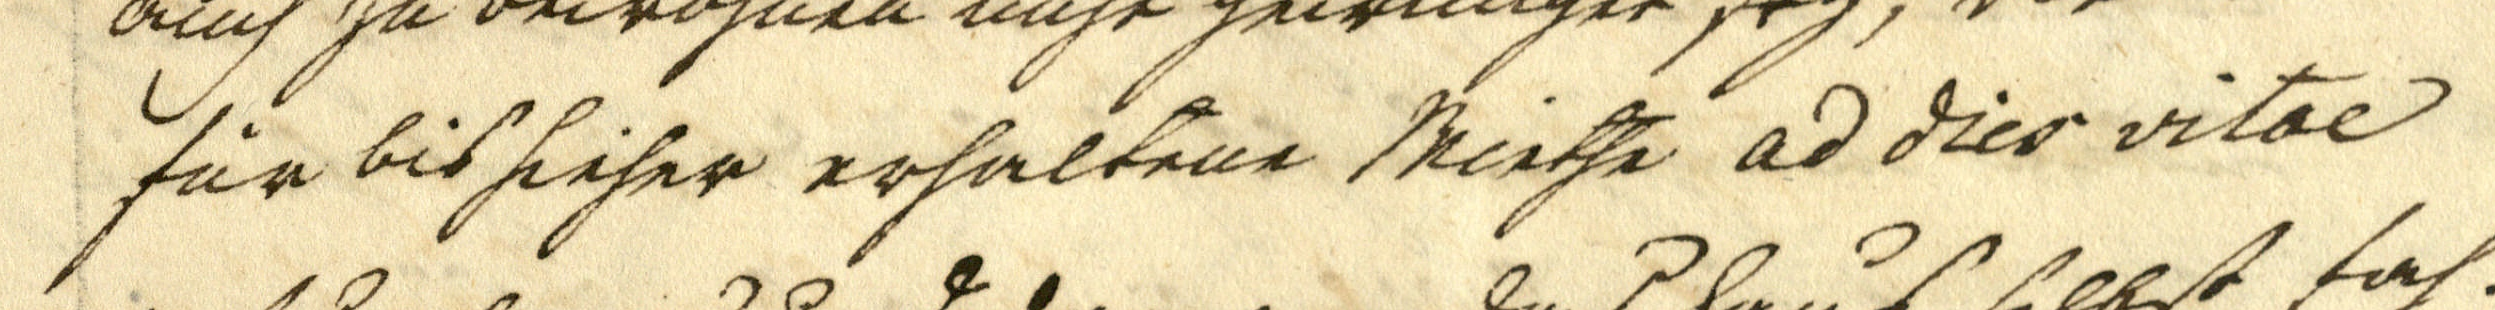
für bis hieher erhaltene Miethe ad dies vitae
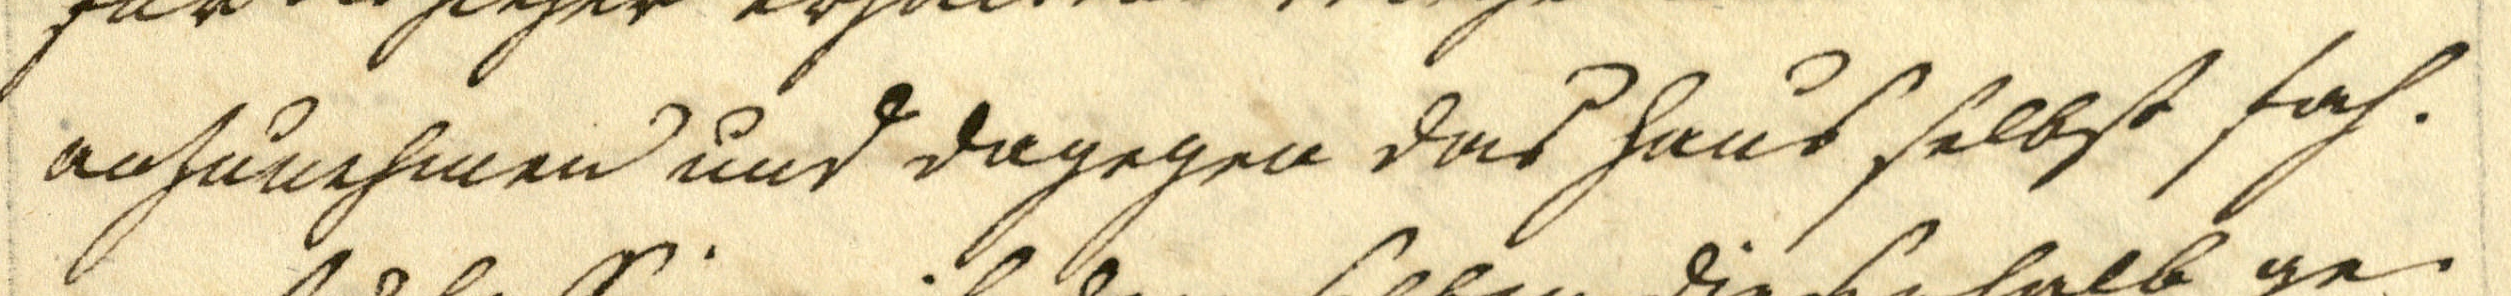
anzunehmen und dagegen das Haus selbst fah¬
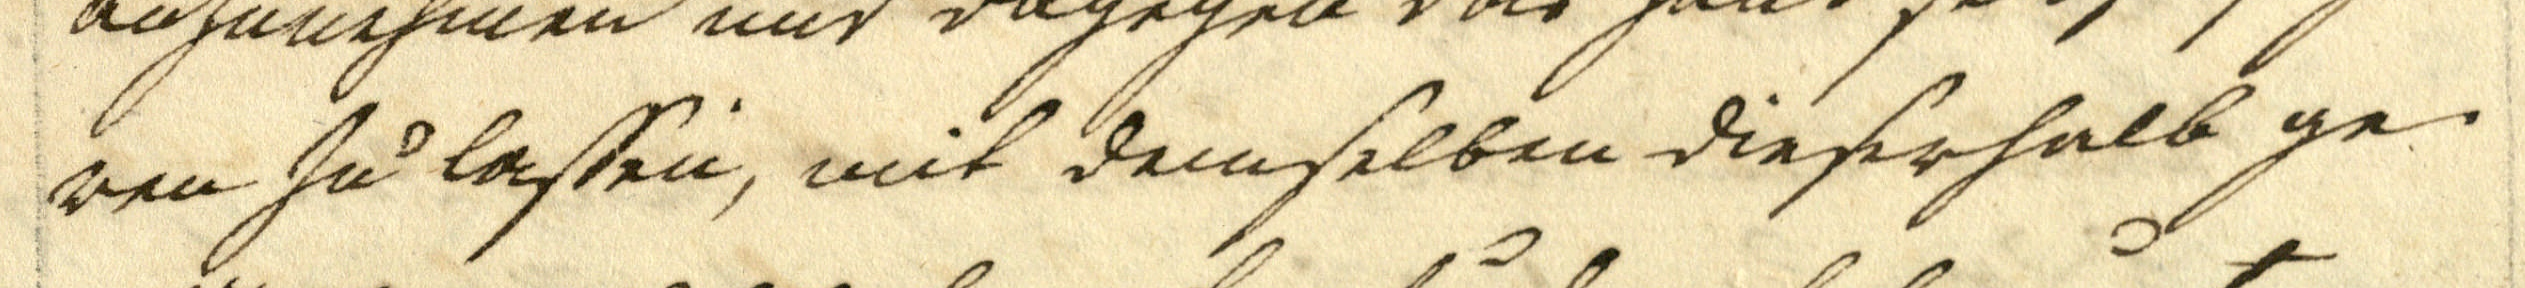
ren zu lassen, mit demselben dieserhalb ge¬
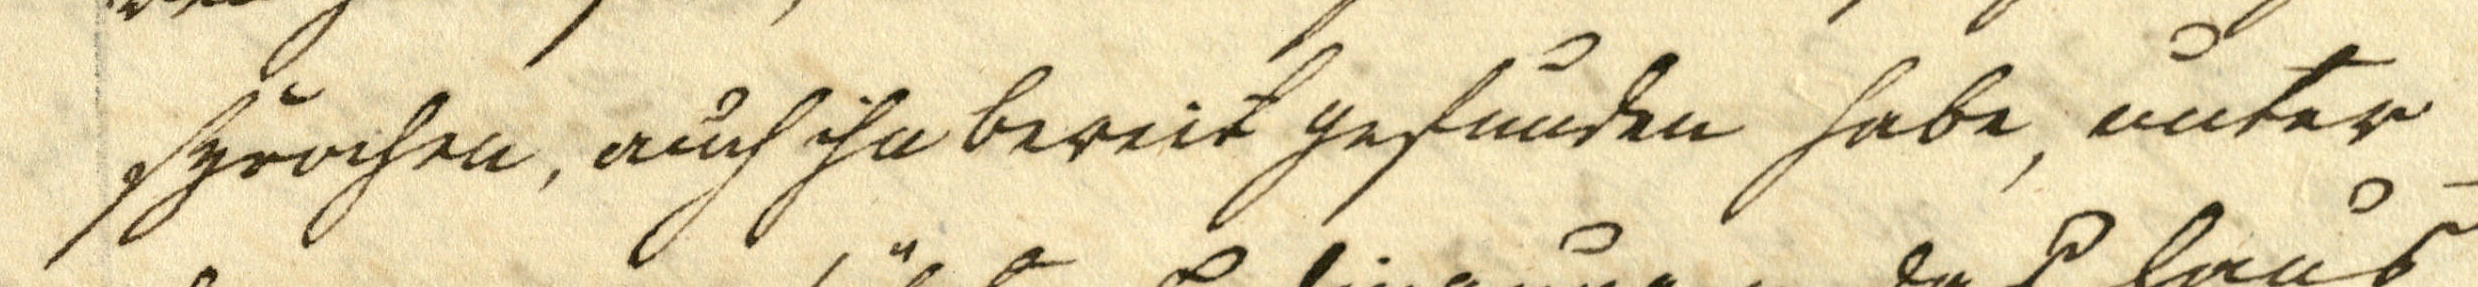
sprochen, auch ihn bereit gefunden habe, unter
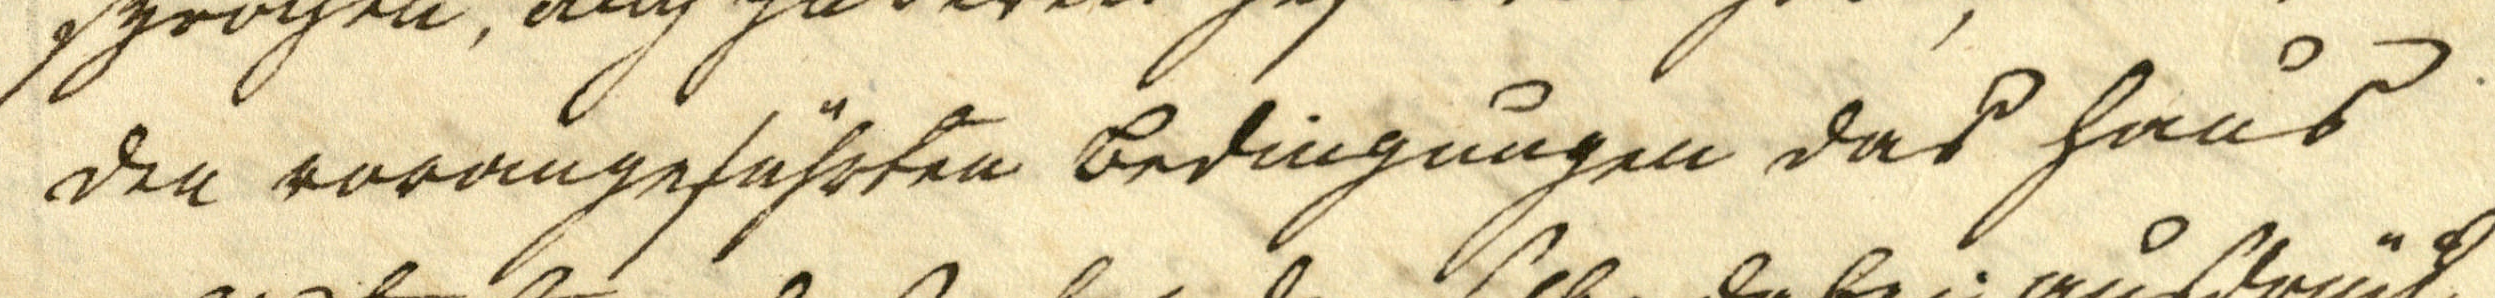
den vorangeführten Bedingungen das Haus
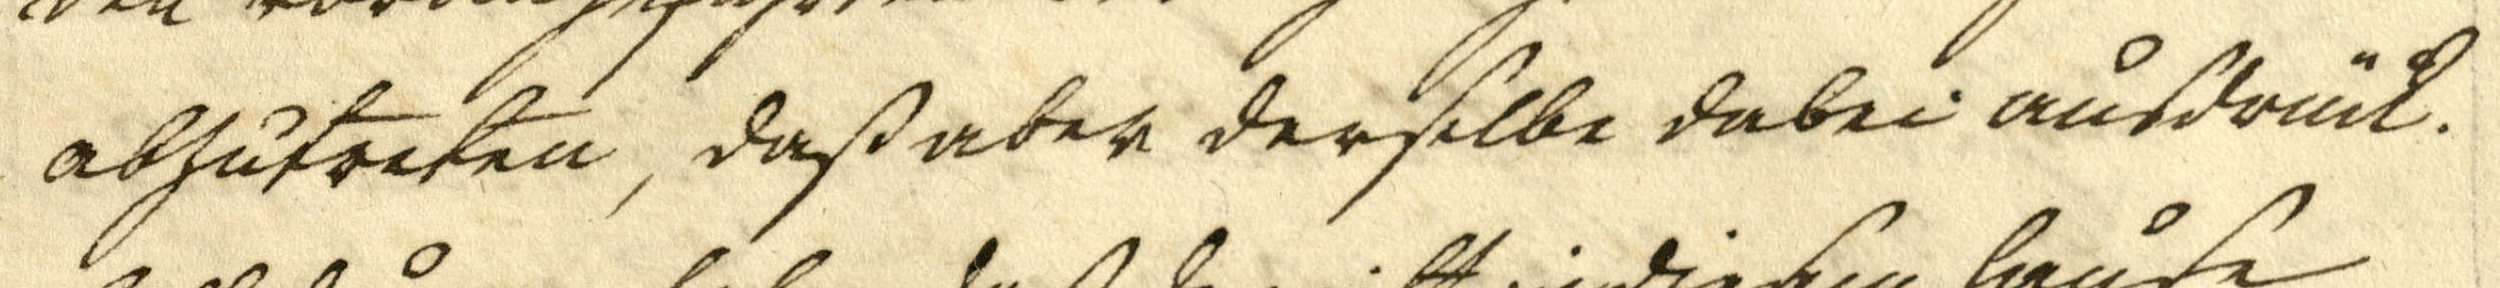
abzutreten, daß aber derselbe dabei ausdrück¬
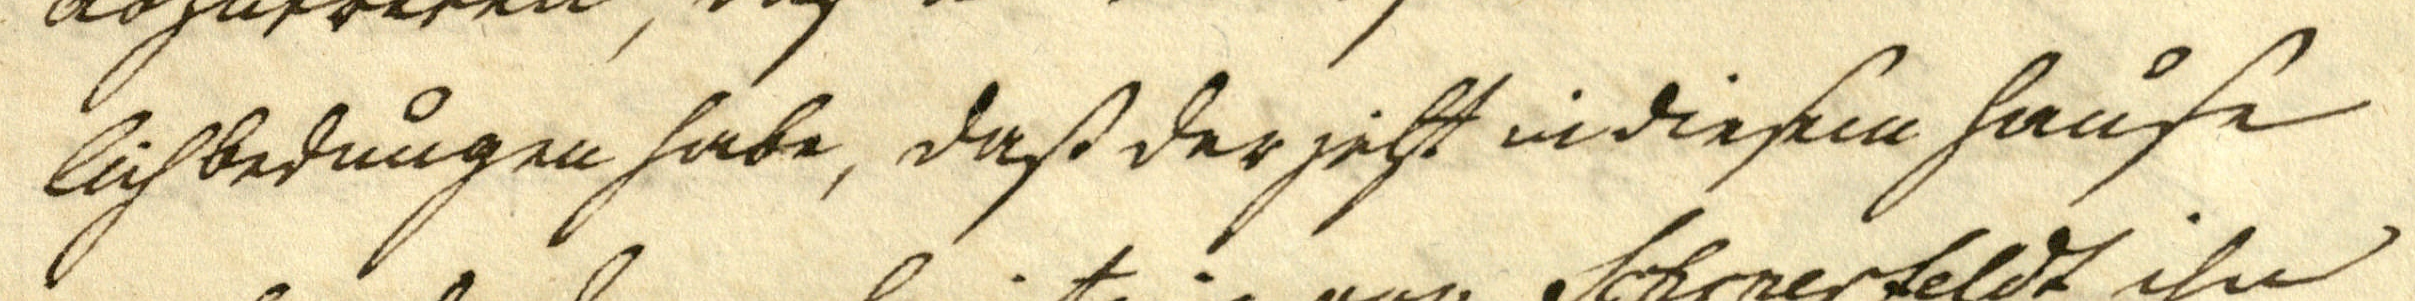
lich bedungen habe, daß der jetzt in diesem Hause
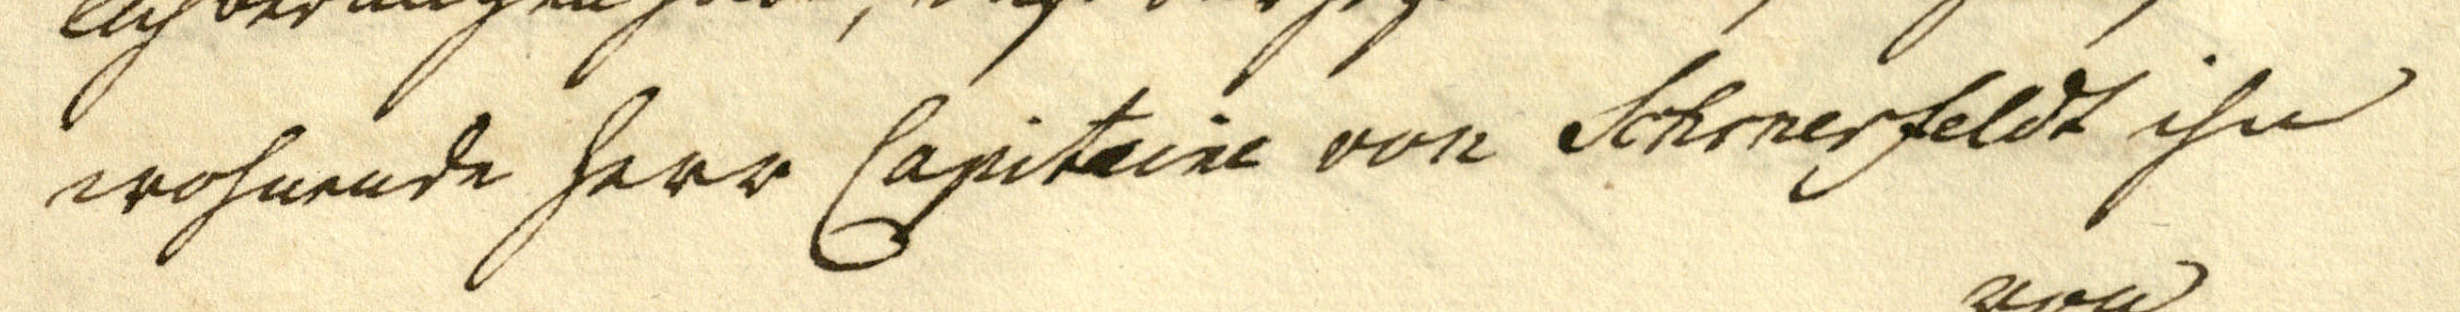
wohnende Herr Capitaine von Schmerfeldt ihn
